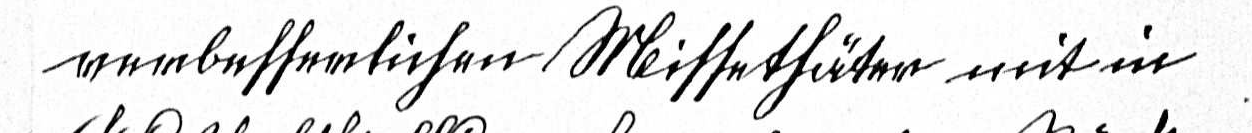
verbesserlichen Missethäter mit in
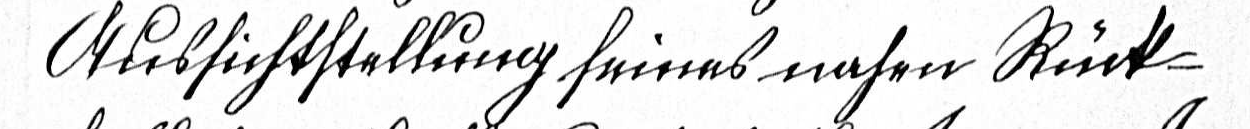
Aussichtstellung seines nahen Rück¬
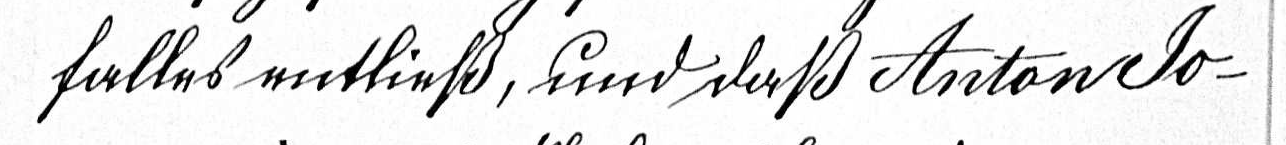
falles entließ, und daß Anton Io¬
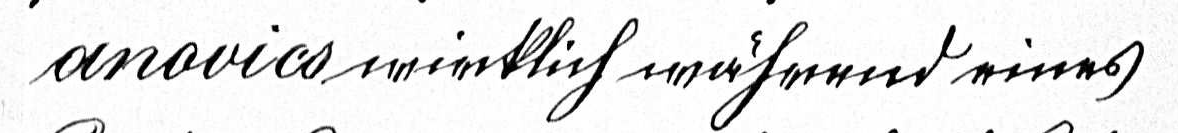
anovics wirklich während eines
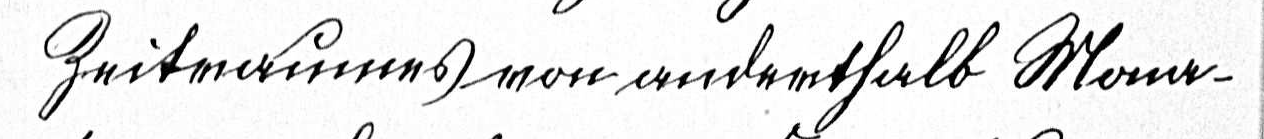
Zeitraumes von anderthalb Mona¬
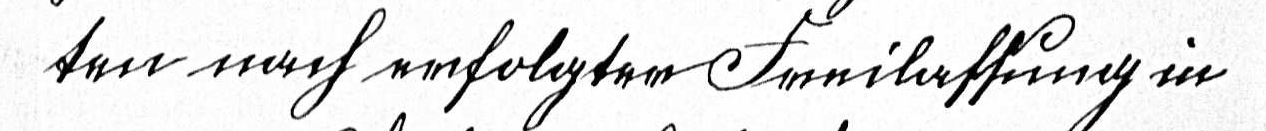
ten nach erfolgten Freilassung in
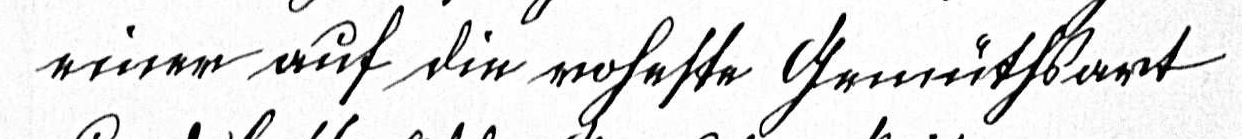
einer auf die roheste Gemüthsart
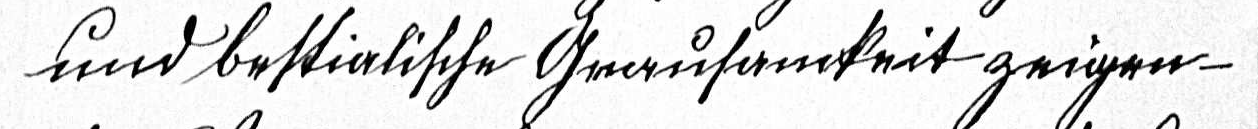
und bestialische Grausamkeit zeigen¬
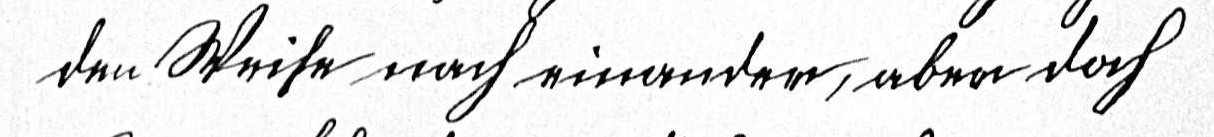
den Weise nach einander, aber doch
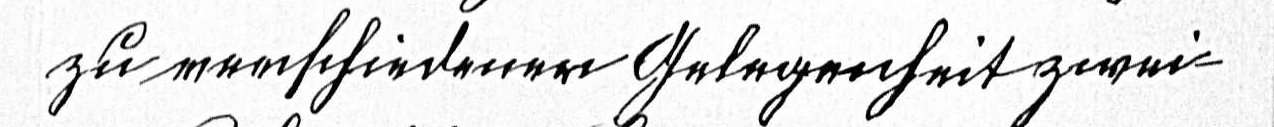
zu verschiedener Gelegenheit zwei¬
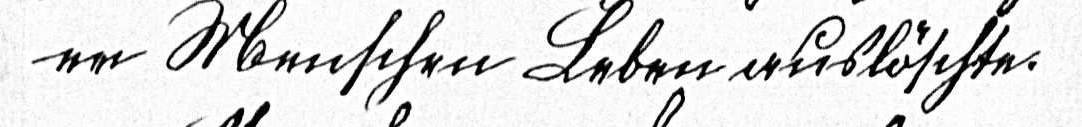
er Menschen Leben auslöschte.
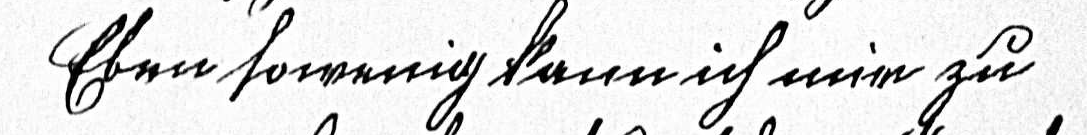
Eben sowenig kann ich mir zu
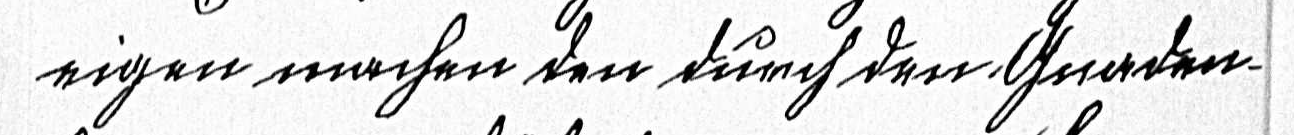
eigen machen den durch den Gnaden¬
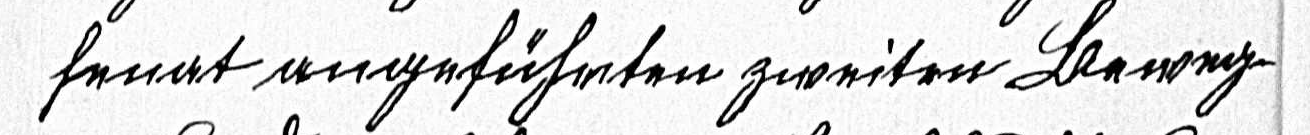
senat angeführten zweiten Beweg¬
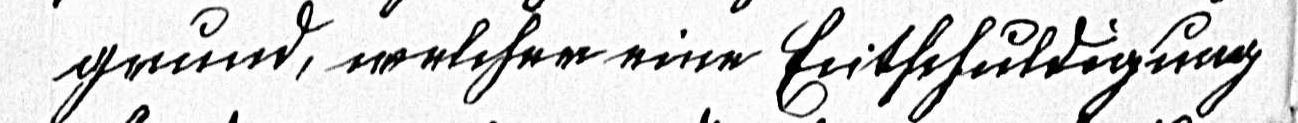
grund, welcher eine Entschuldigung
